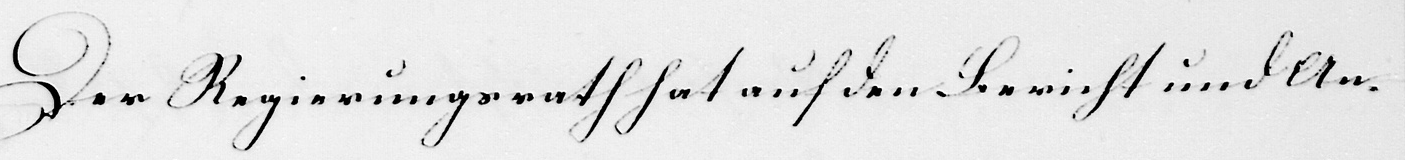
Der Regierungsrath hat auf den Bericht und An¬
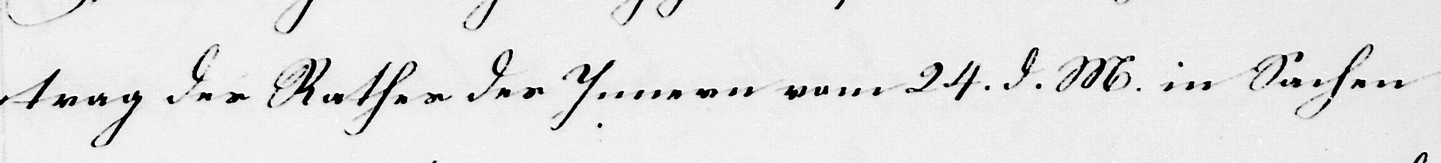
trag des Rathes des Innern vom 24. d. M. in Sachen
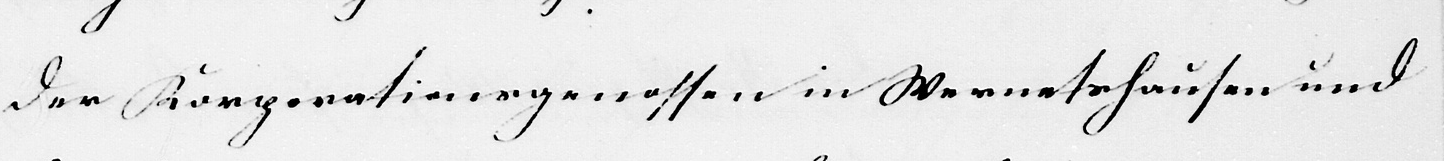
der Korporationsgenossen in Wernetshausen und
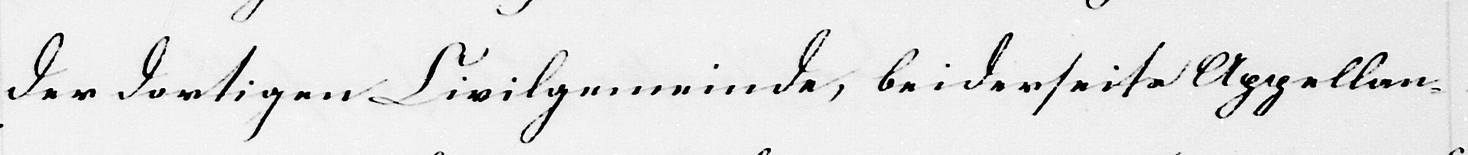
der dortigen Civilgemeinde, beiderseits Appellan¬
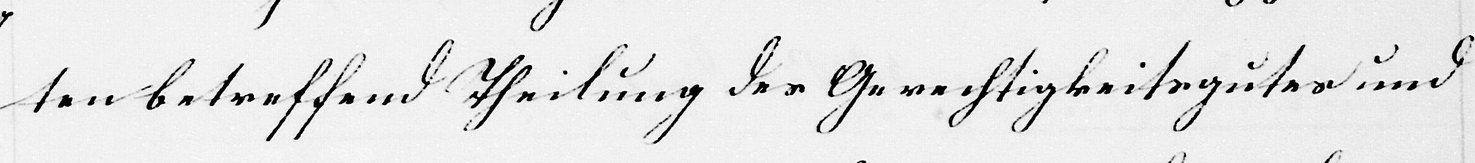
ten betreffend Theilung des Gerechtigkeitsgutes und
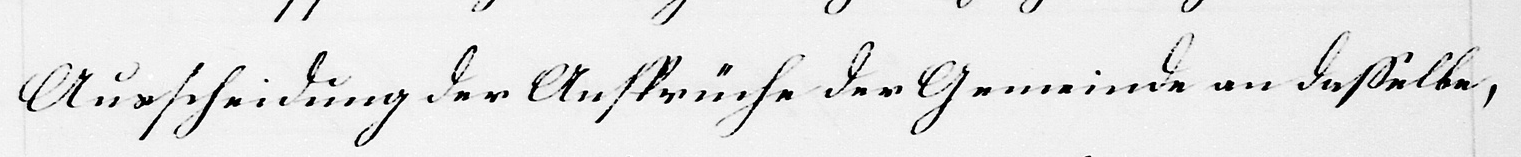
Ausscheidung der Ansprüche der Gemeinde an daßelbe,
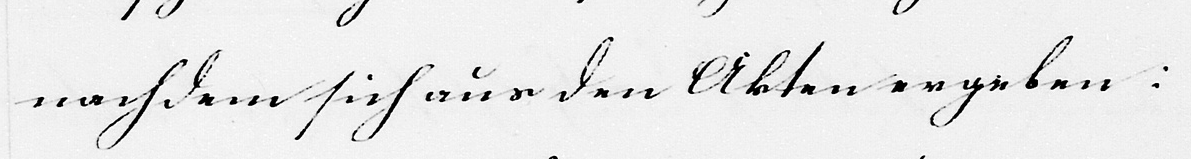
nachdem sich aus den Akten ergeben:
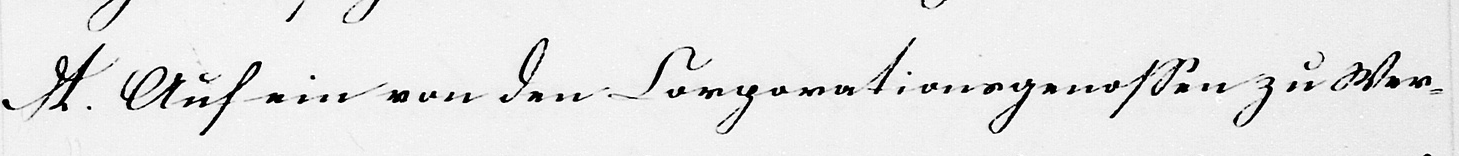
A. Auf ein von den Corporationsgenoßen zu Wer¬
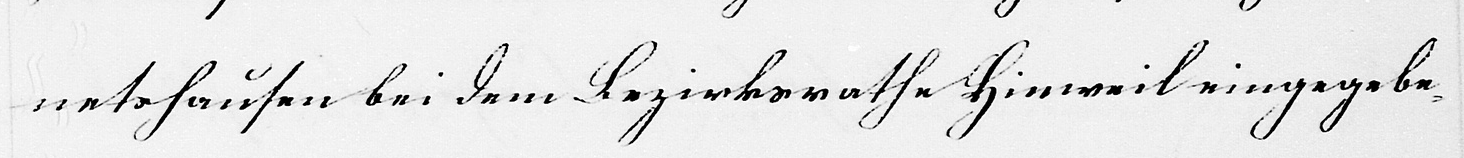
netshausen bei dem Bezirksrathe Hinweil eingegebe¬
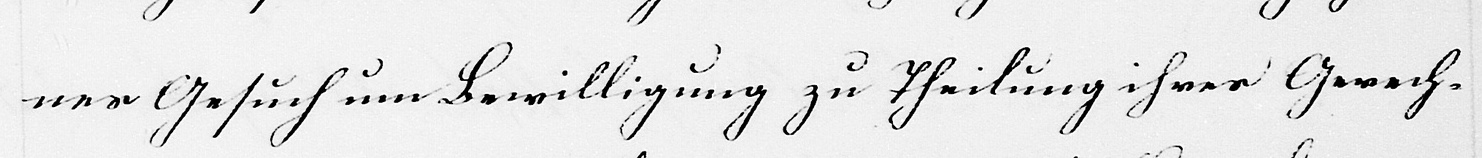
nes Gesuch um Bewilligung zu Theilung ihres Gerech¬
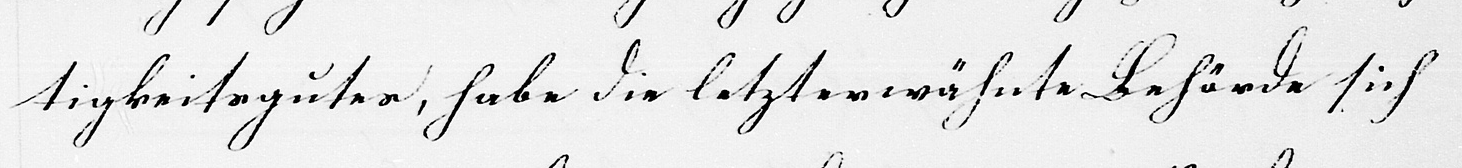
tigkeitsgutes, habe die letzterwähnte Behörde sich
